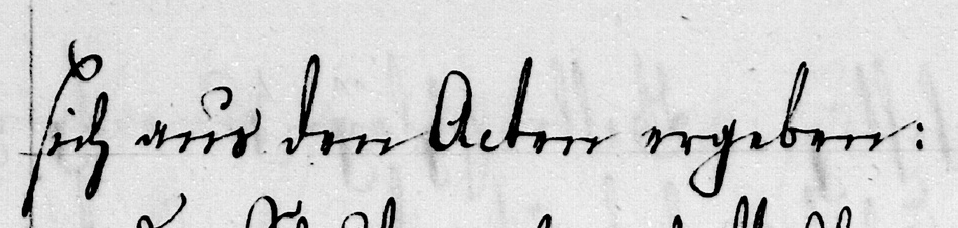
sich aus den Acten ergeben:
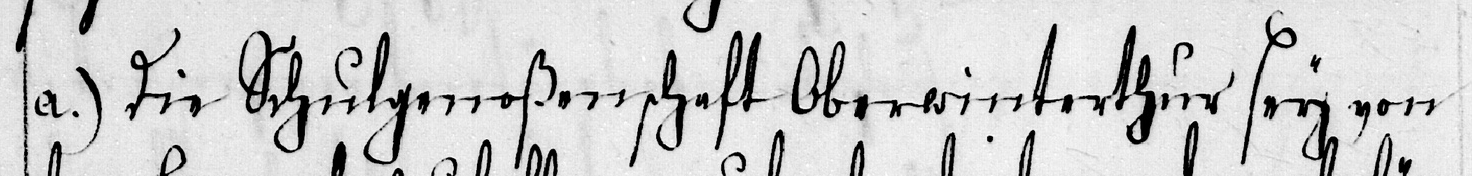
a.) Die Schulgenoßenschaft Oberwinterthur sey von
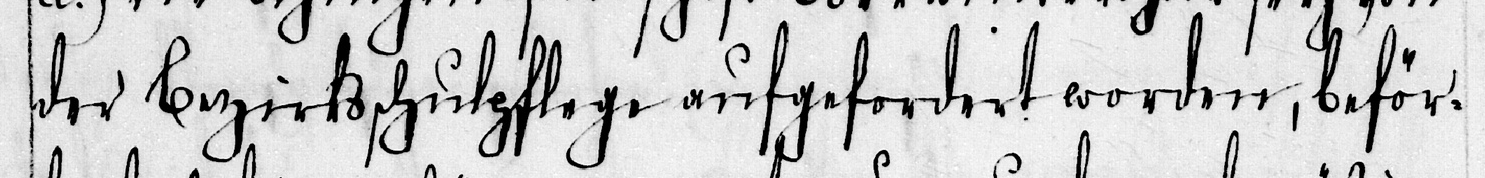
der Bezirksschulpflege aufgefordert worden, beför¬
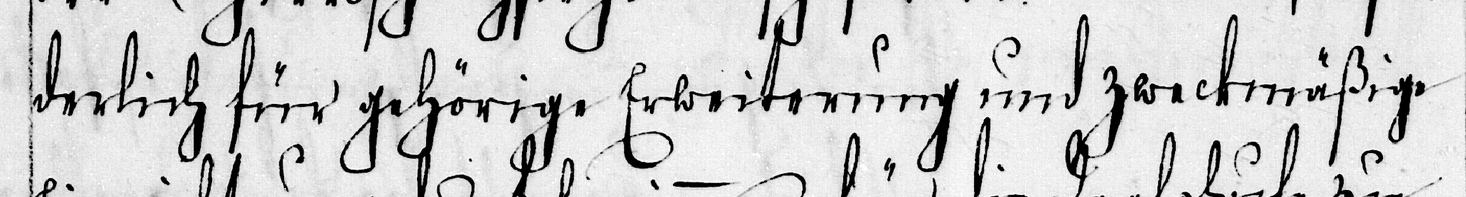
derlich für gehörige Erweiterung und zweckmäßige
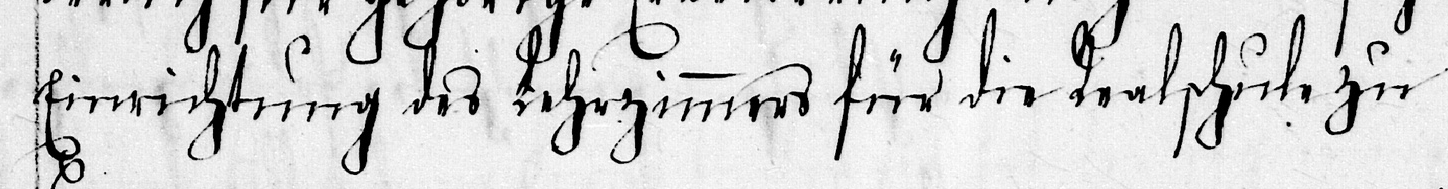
Einrichtung des Lehrzimmers für die Realschule zu
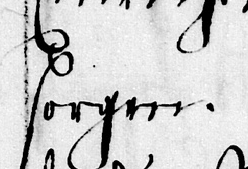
sorgen.
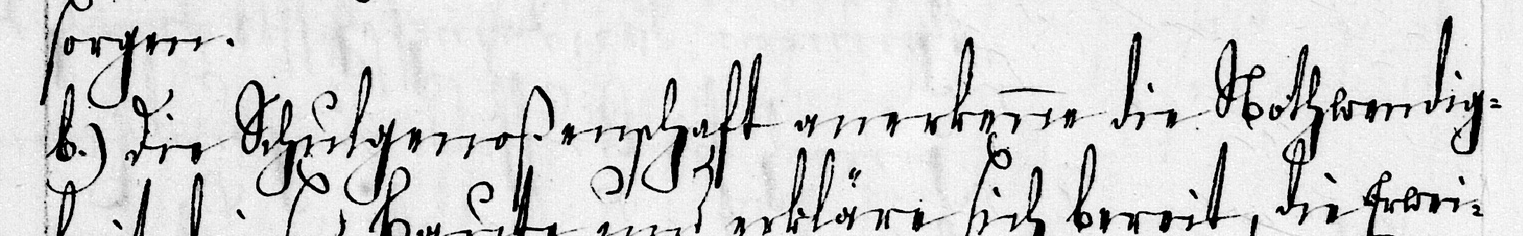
b.) Die Schulgenoßenschaft anerkenne die Nothwendig¬
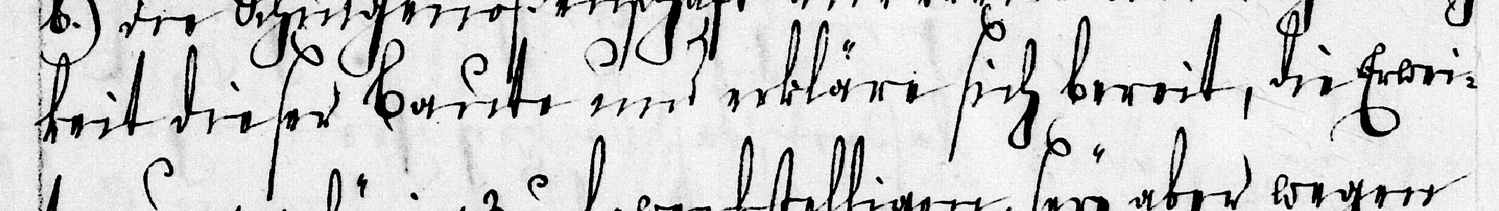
keit dieser Baute und erkläre sich bereit, die Erwei¬
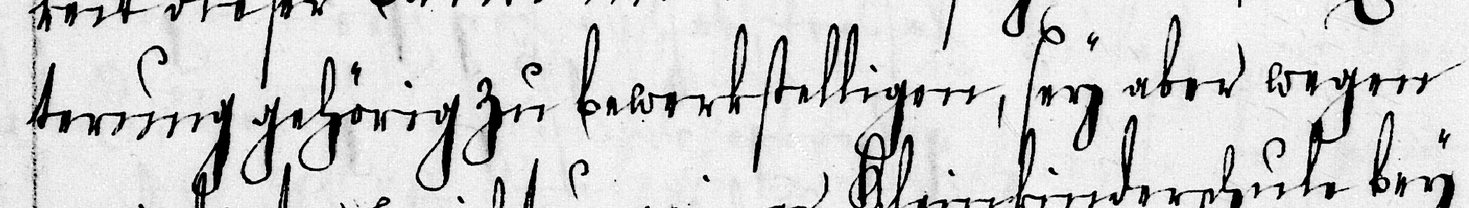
terung gehörig zu bewerkstelligen, sey aber wegen
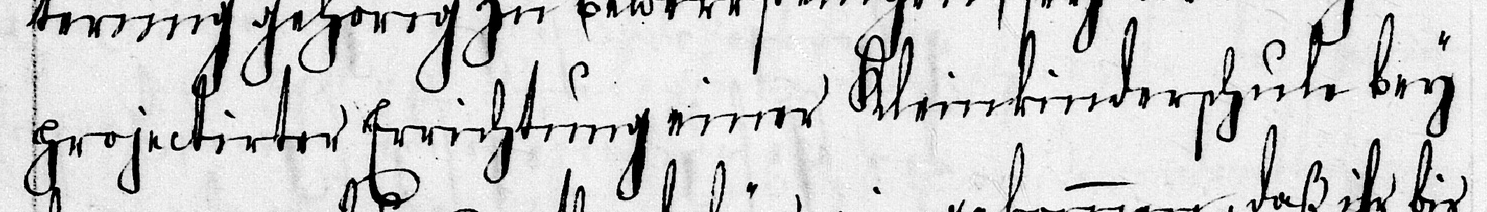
projectirter Errichtung einer Kleinkinderschule bey
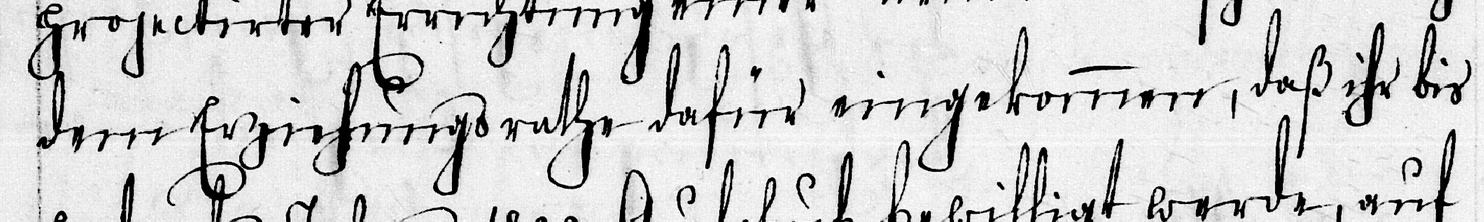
dem Erziehungsrathe dafür eingekommen, daß ihr bis
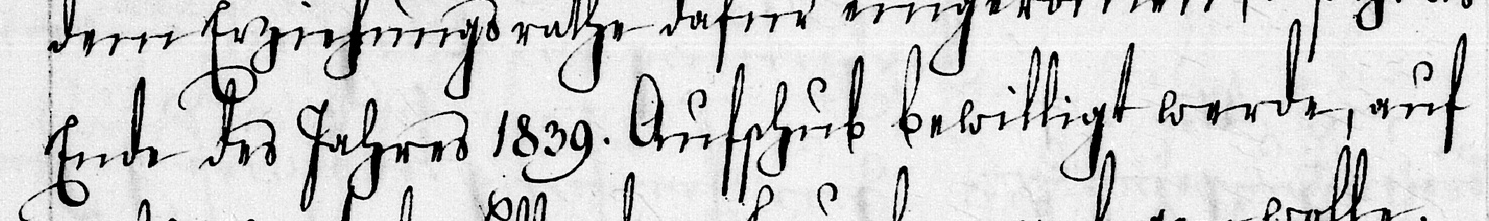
Ende des Jahres 1839. Aufschub bewilligt werde, auf
